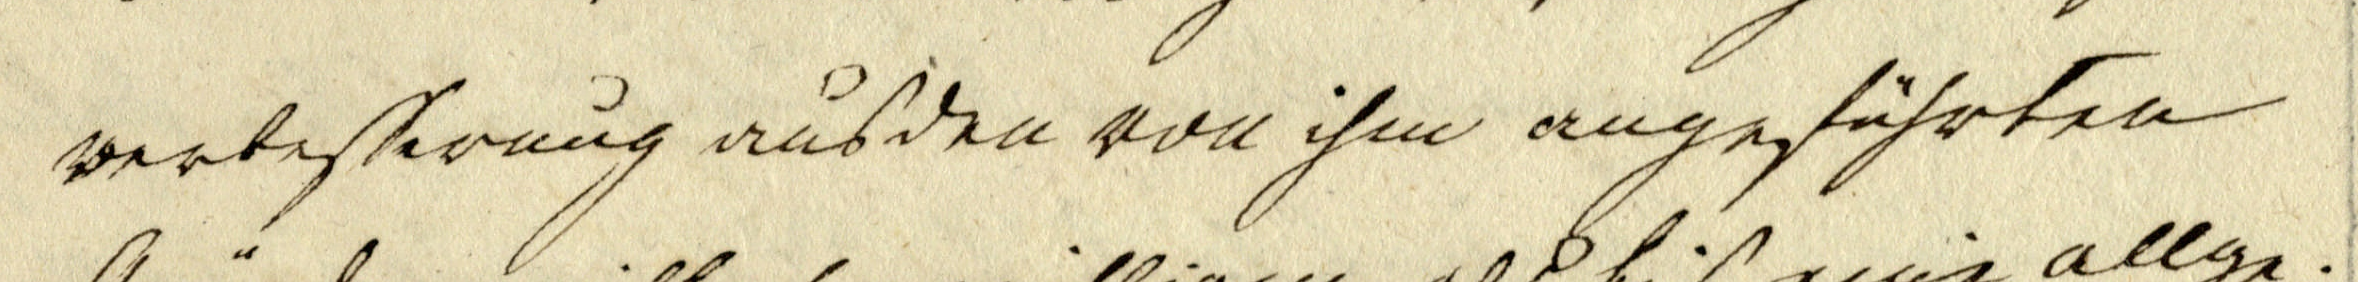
verbesserung aus den von ihm angeführten
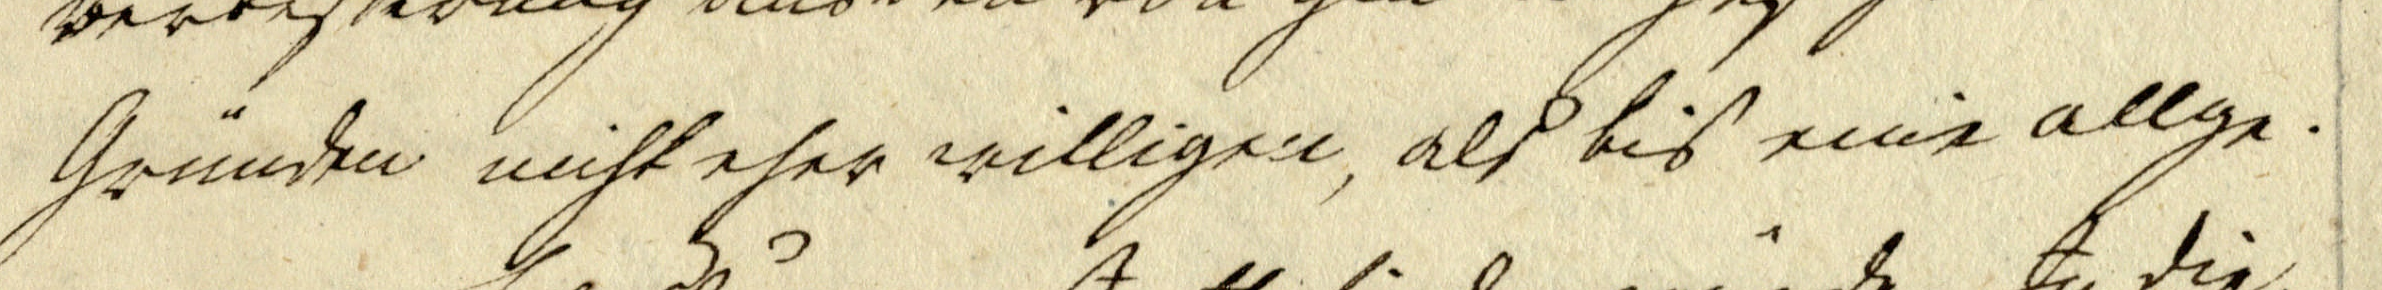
Gründen nicht eher willigen, als bis eine allge¬
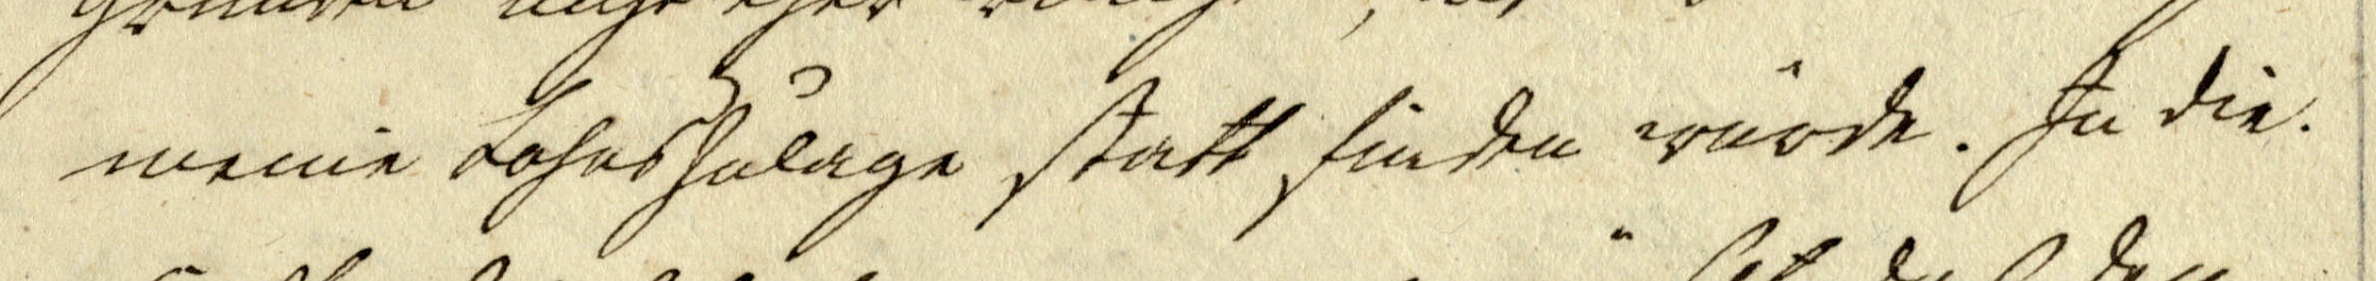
meine Lohnszulage statt finden würde. In die¬
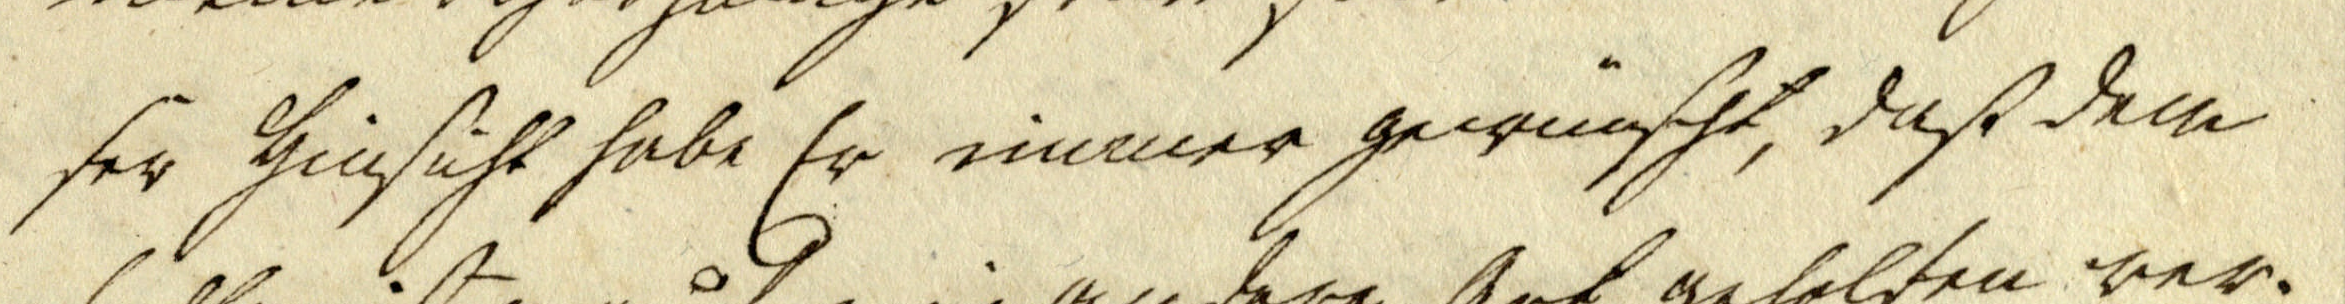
ser Hinsicht habe Er immer gewünscht, daß dem
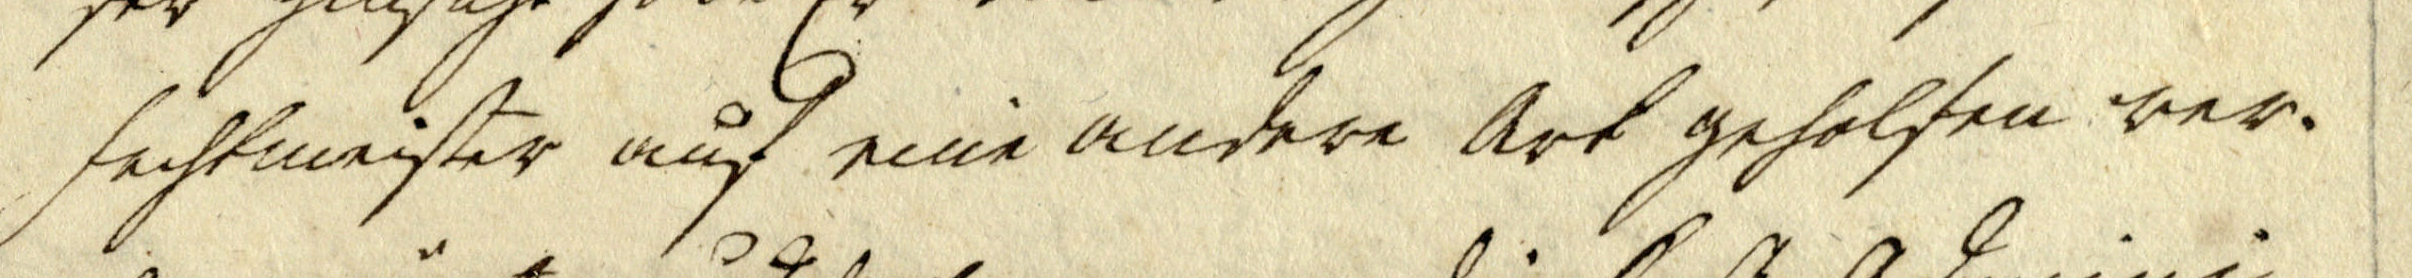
Fechtmeister auf eine andere Art geholfen wer¬
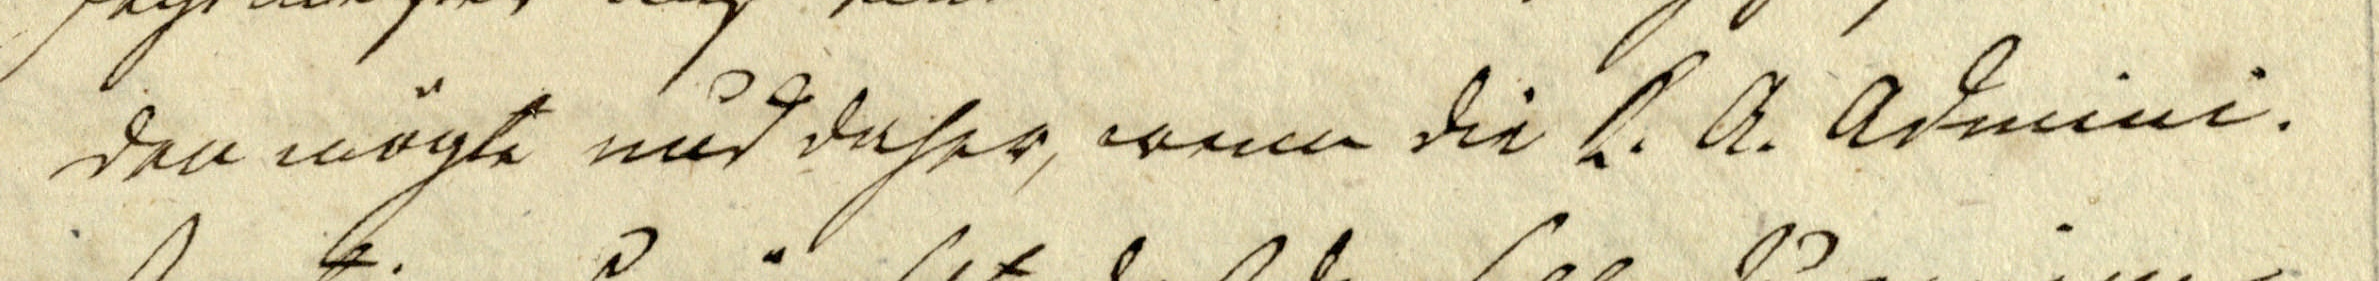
den mögte und daher, wenn die K. A. Admini¬
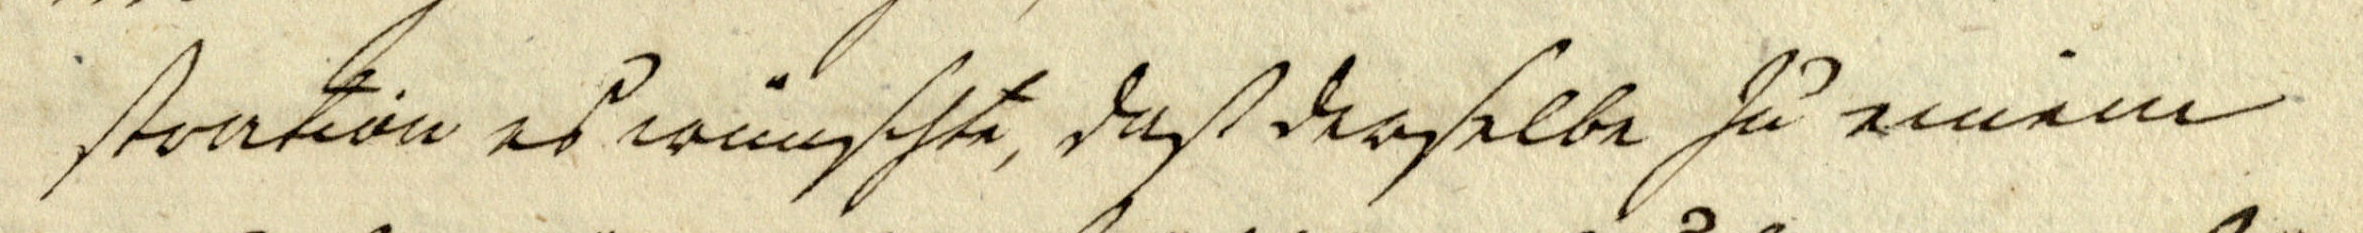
stration es wünschte, daß derselbe zu einem
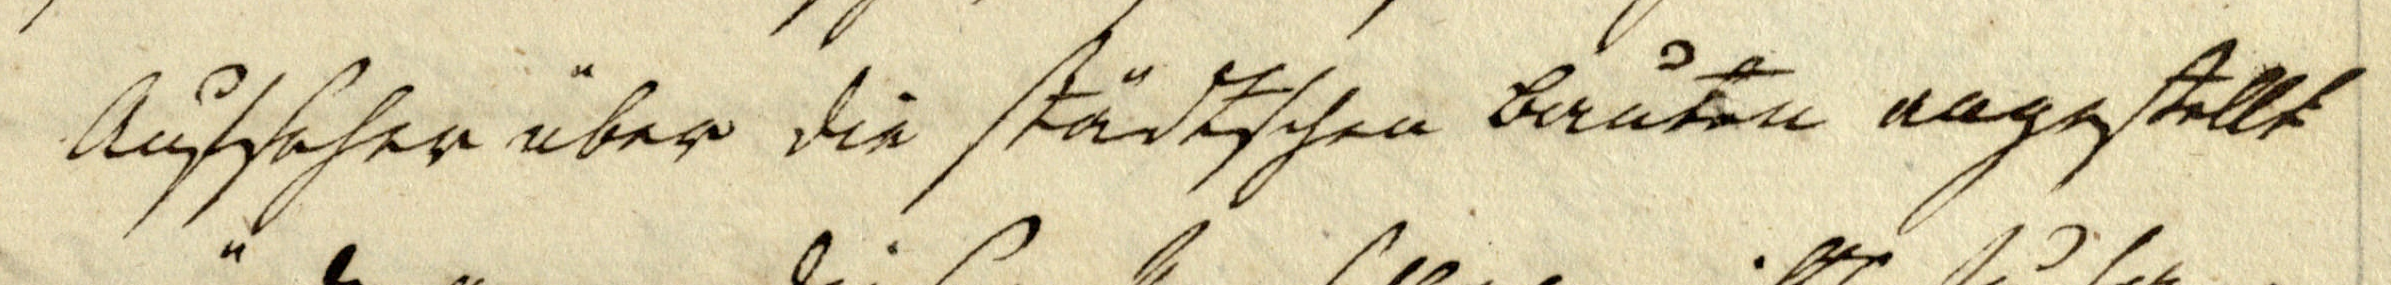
Aufseher über die städtischen Bauten angestellt
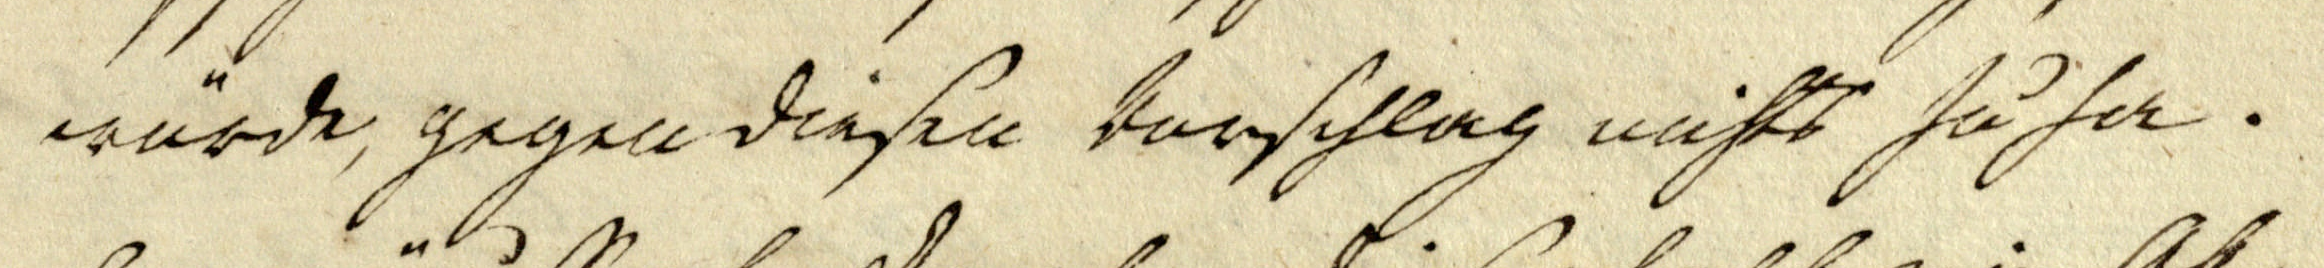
würde, gegen diesen Vorschlag nichts zu ha¬
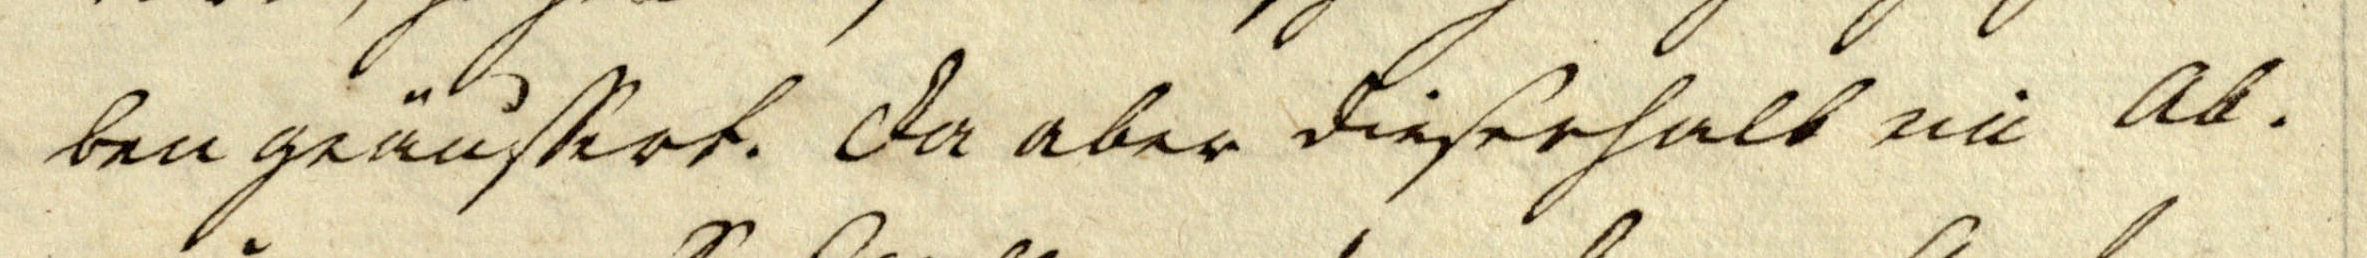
ben geäussert. Da aber dieserhalb ein Ab¬
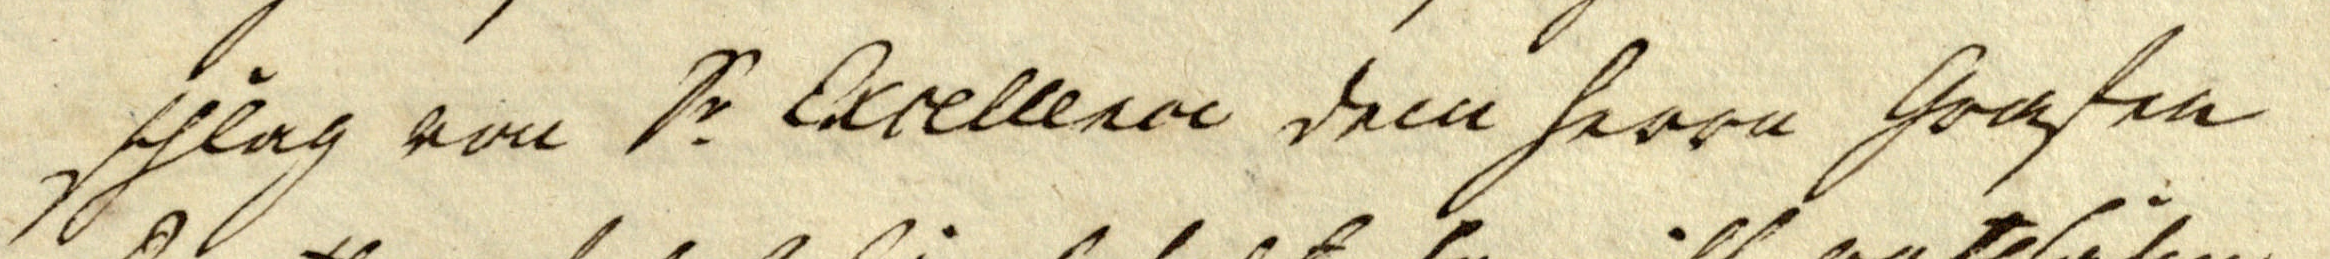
schlag von Sr Excellence dem Herrn Grafen
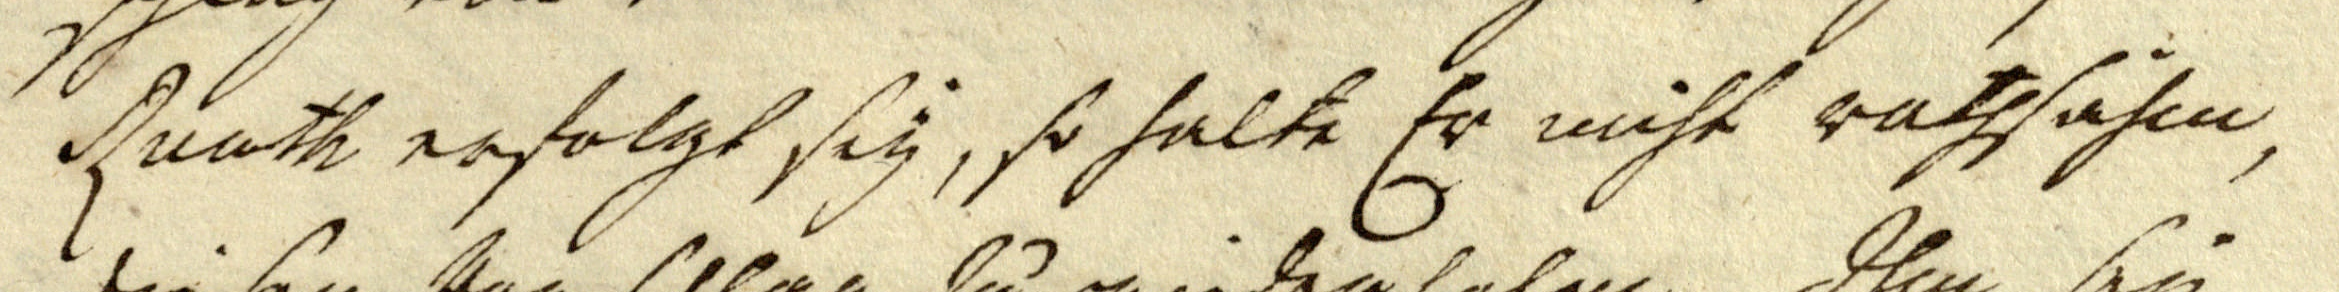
Ruuth erfolgt seÿ, so halte Er nicht rathsahm,
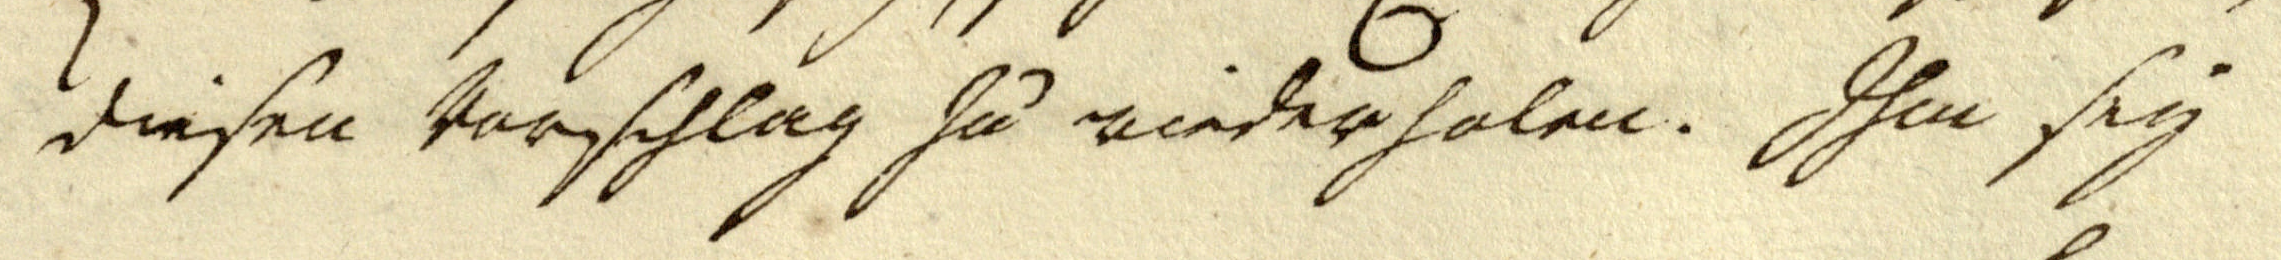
diesen Vorschlag zu wiederholen. Ihm seÿ
